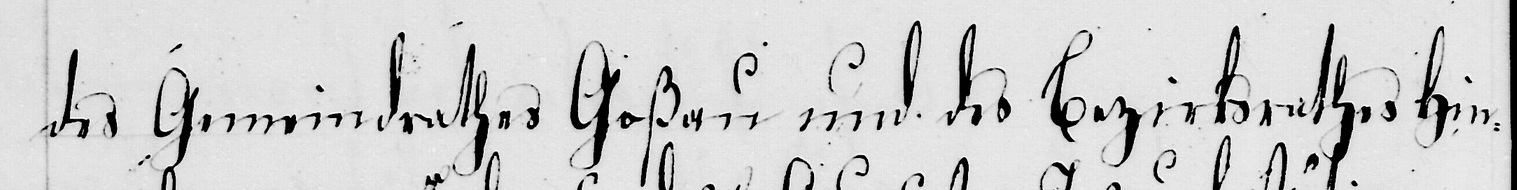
des Gemeindrathes Goßau und des Bezirksrathes Hin¬
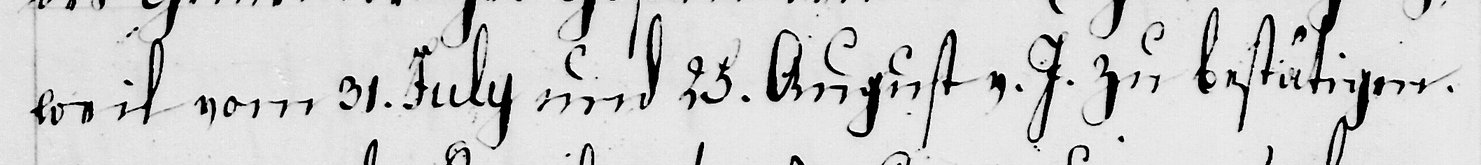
weil vom 31. Juli und 25. August v. J. zu bestätigen.
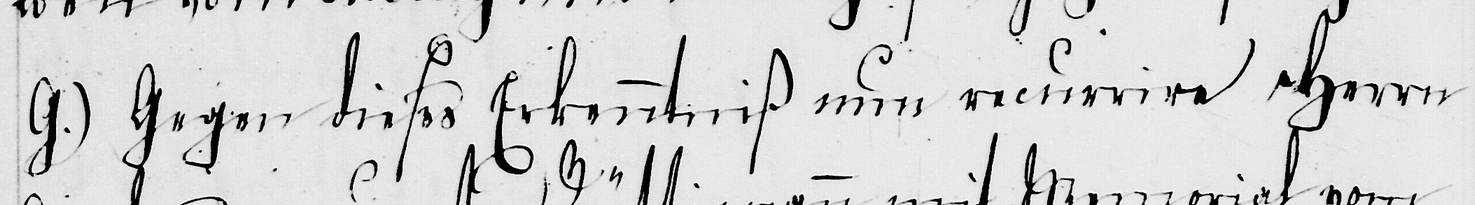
G.) Gegen dieses Erkenntniß nun recurrire Herrn
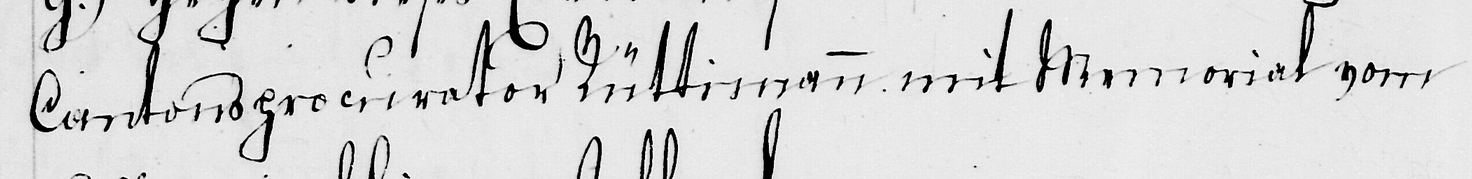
Cantonsprocurator Rüttimann mit Memorial vom
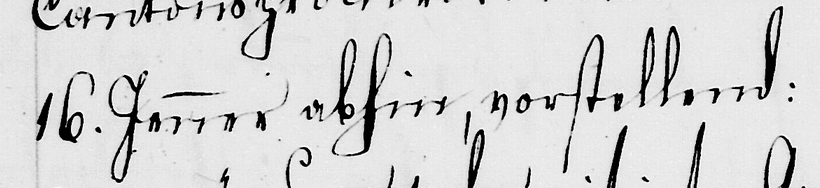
16. Jenner abhin, vorstellend:
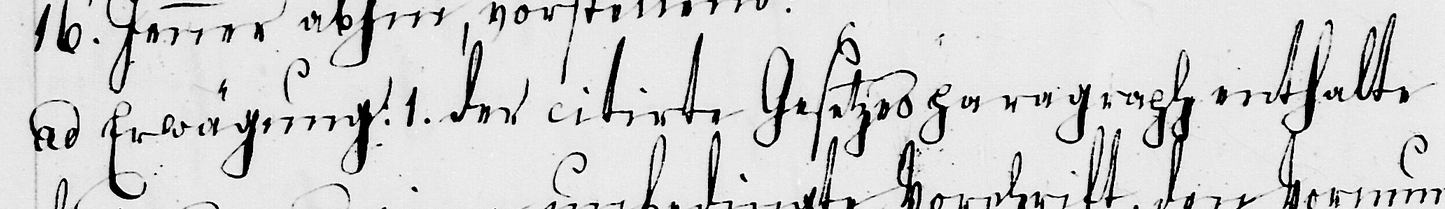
ad Erwägung: 1. der citirte Gesetzesparagraph enthalte
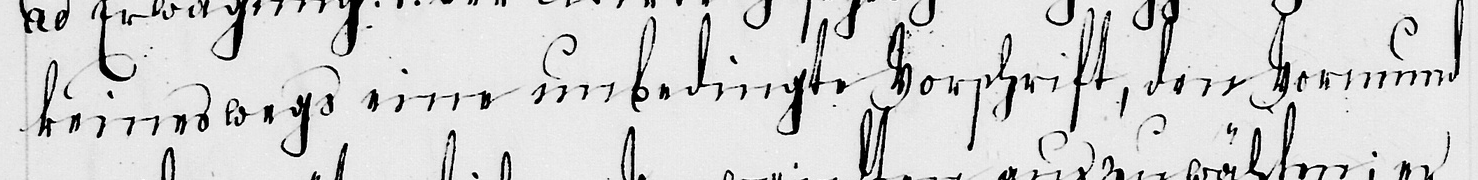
keineswegs eine unbedingte Vorschrift, den Vormund
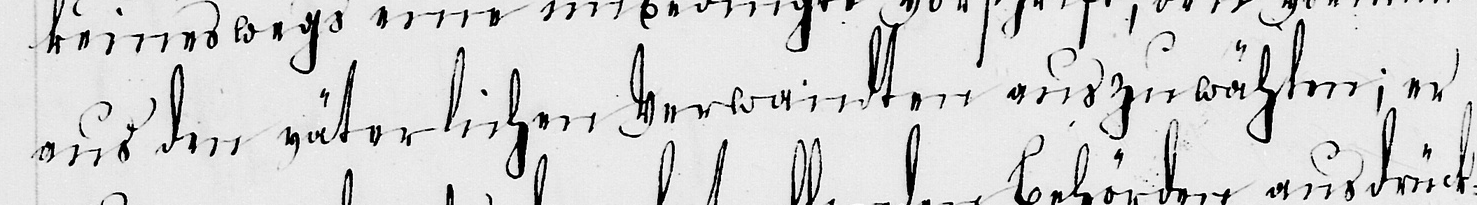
aus den väterlichen Verwandten auszuwählen; er
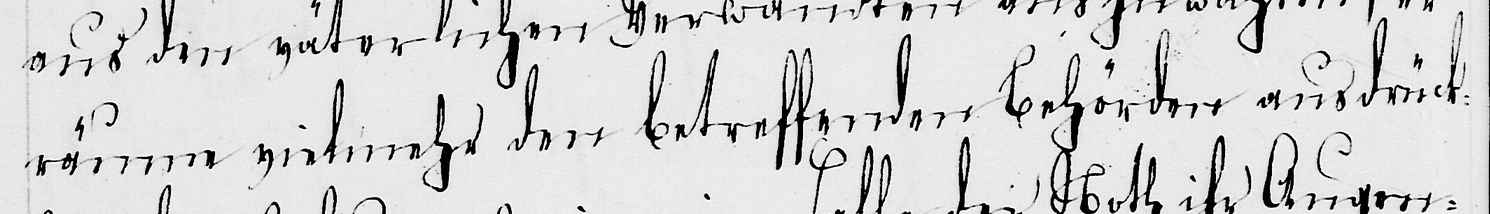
räume vielmehr den betreffenden Behörden ausdrück¬
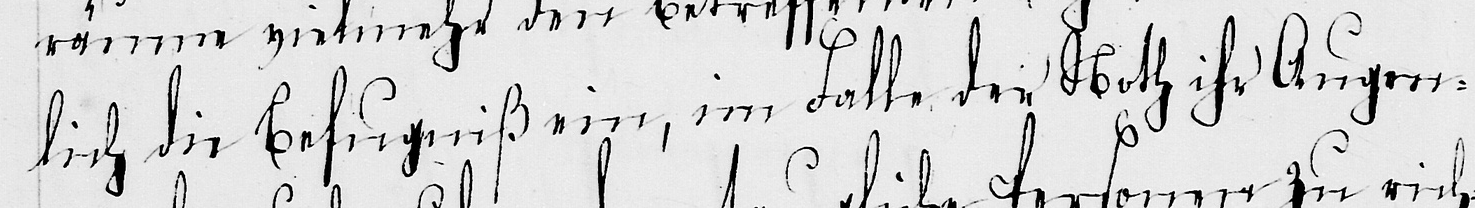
lich die Befugniß ein, im Falle der Noth ihr Augen¬
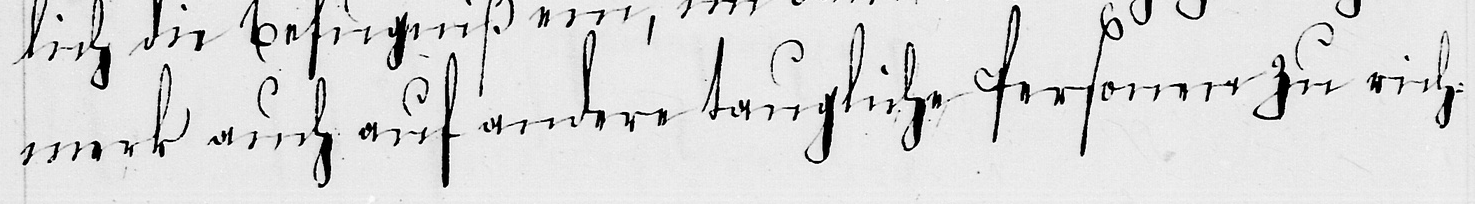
merk auch auf andere taugliche Personen zu rich¬
